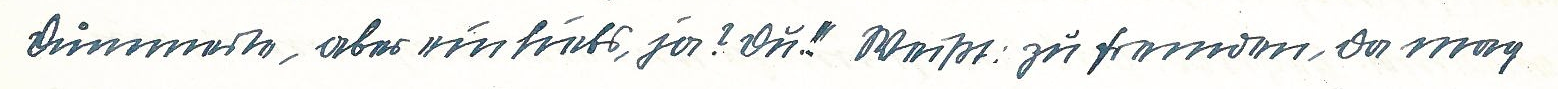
Dummerle, aber ein liebes, ja? Du!! Weißt: zu Fremden, da mag
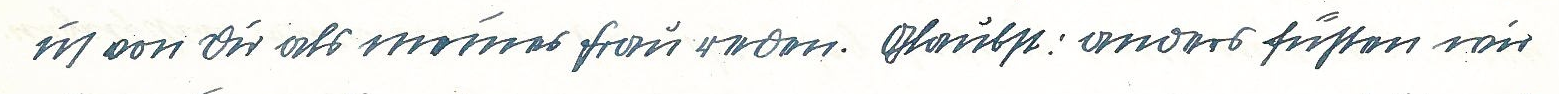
ich von Dir als meiner Frau reden. Glaubst: anders fühlen wir
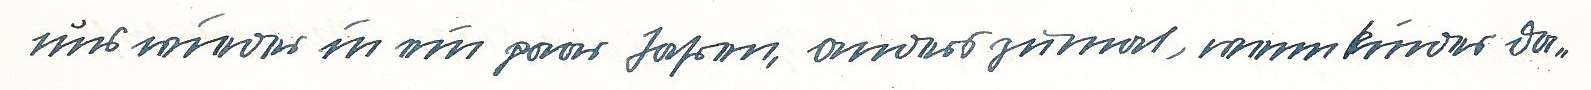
uns wieder in ein paar Jahren, anders zumal, wenn Kinder da
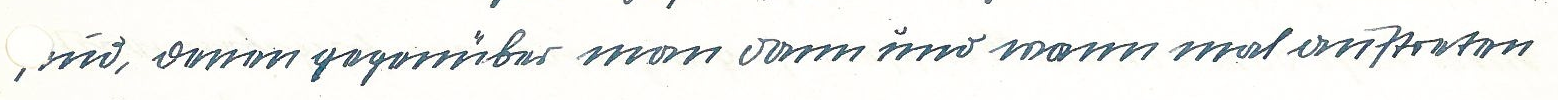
ind, denen gegenüber man dann und wann mal auftreten
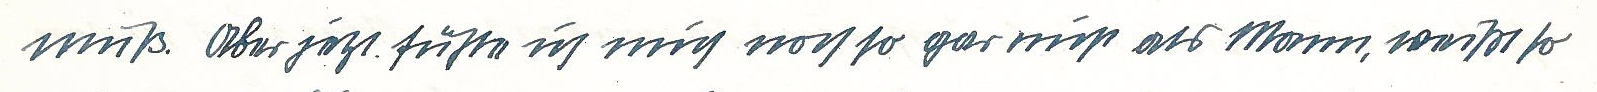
muß. Aber jetzt fühle ich mich noch so gar nicht als Mann, weißt so
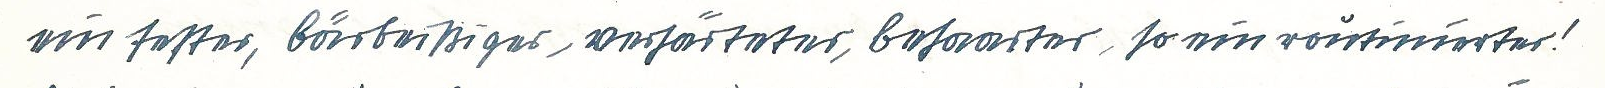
ein fester, bärbeißiger, verhärteter, behaarter, so ein routinierter!
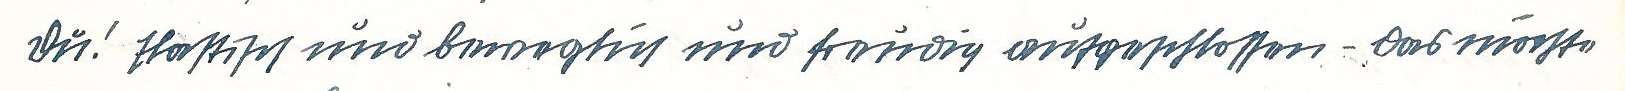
Du! Elastisch und beweglich und freudig aufgeschlossen – das möchte
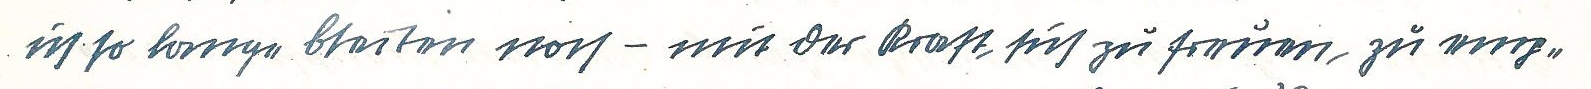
ich so lange bleiben noch – mit der Kraft, sich zu freuen, zu emp¬
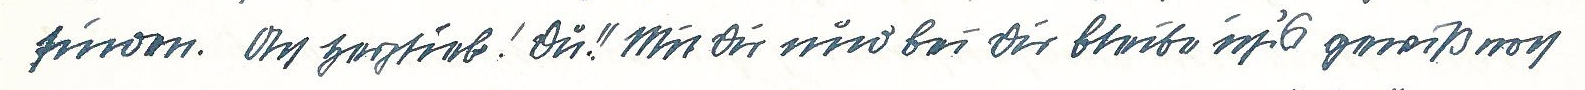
finden. Ach Herzlieb! Du!! Mit Dir und bei Dir bleibe ich’s gewiß noch
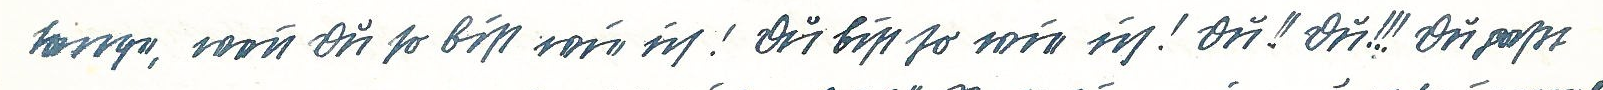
lange, wen Du so bist wie ich! Du bist so wie ich! Du!! Du!!! Du paßt
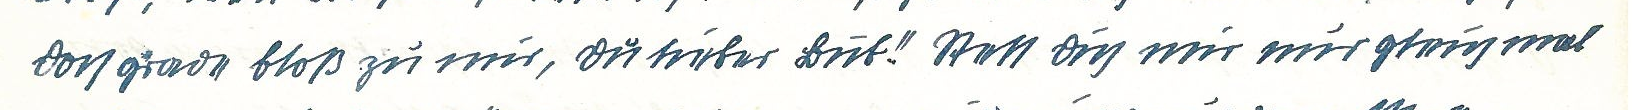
doch gerade bloß zu mir, Du lieber Bub!! Stell Dich mir nur gleich mal
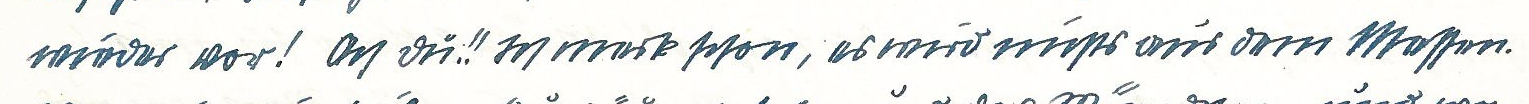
wieder vor! Ach Du!! Ich merk schon, es wird nichts aus dem Messen.
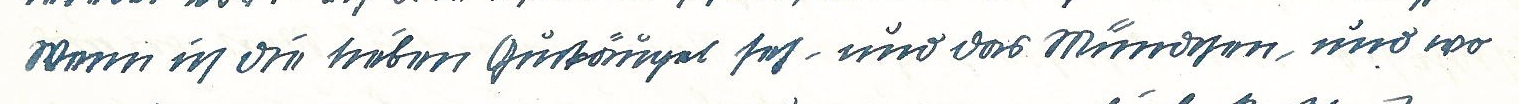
Wenn ich die lieben Guckäugel seh – und das Mündchen, und wo
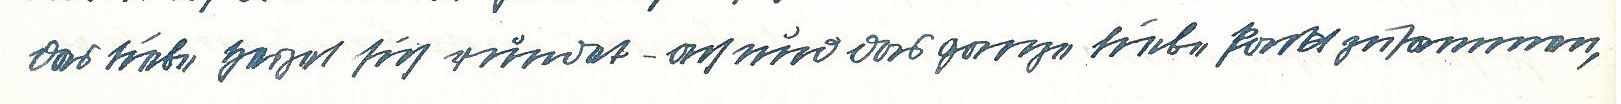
das liebe Herzel sich rundet – ach und das ganze liebe Packl zusammen,
